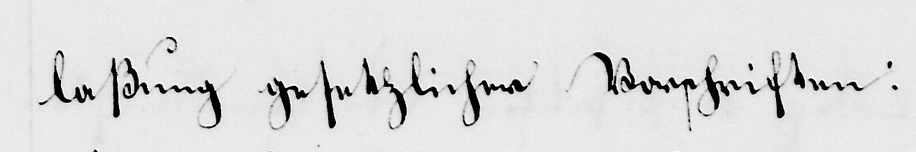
laßung gesetzlicher Vorschriften:
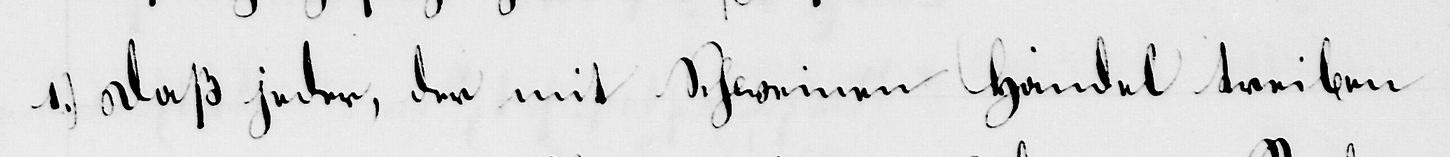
1.) Daß jeder, der mit Schweinen Handel treiben
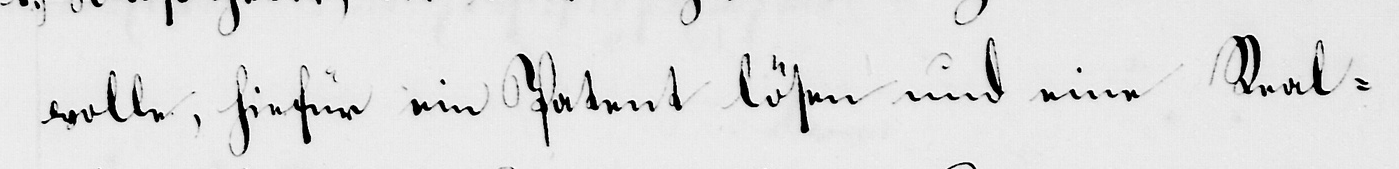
wolle, hiefür ein Patent lösen und eine Real-
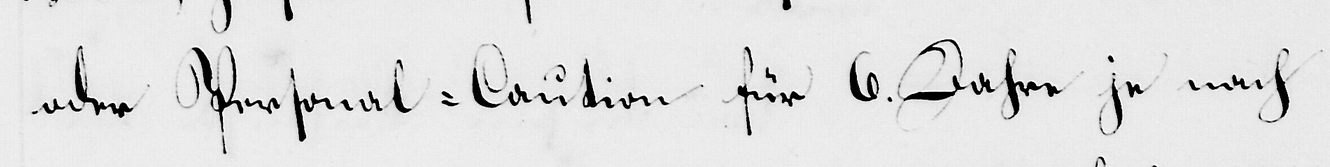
oder Personal-Caution für 6. Jahre je nach
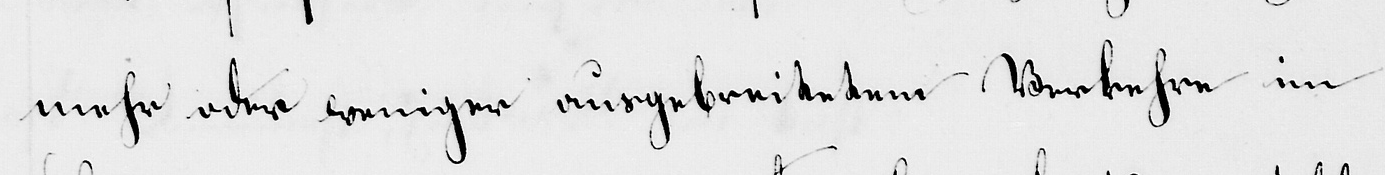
mehr oder weniger ausgebreitetem Verkehre im
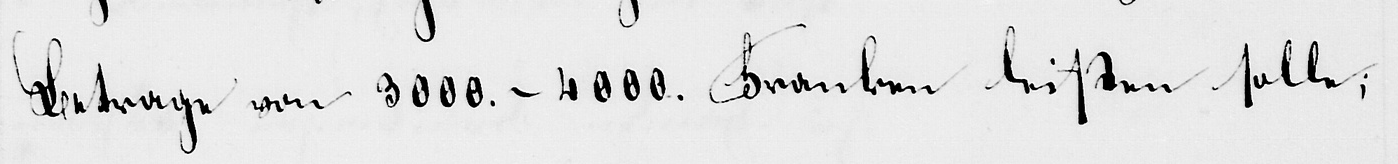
Betrage von 3000. – 4000. Franken leisten solle;
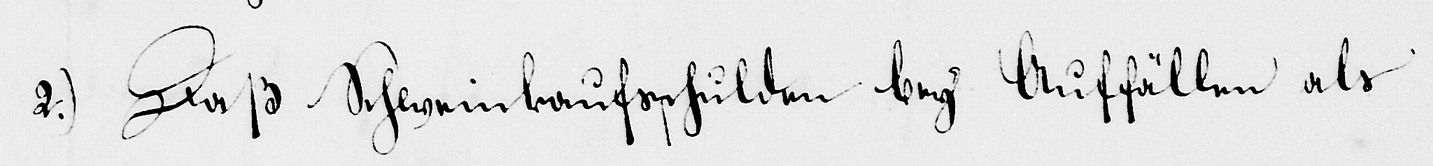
2.) Daß Schweinkaufsschulden bey Auffällen als
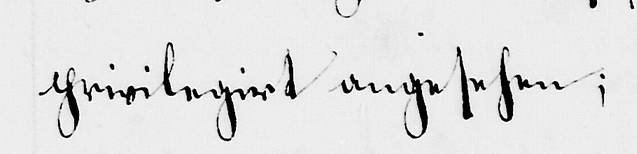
privilegirt angesehen;
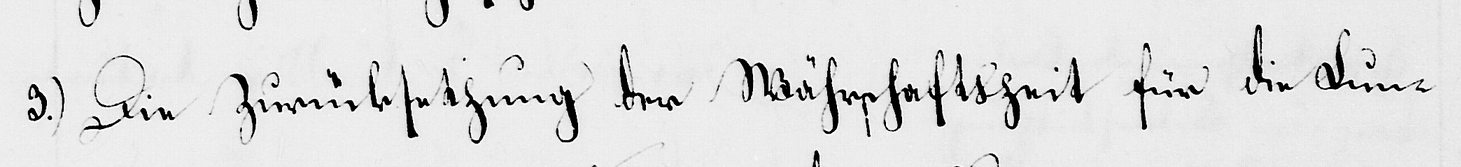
3.) Die Zurücksetzung der Währschaftszeit für die Lun¬
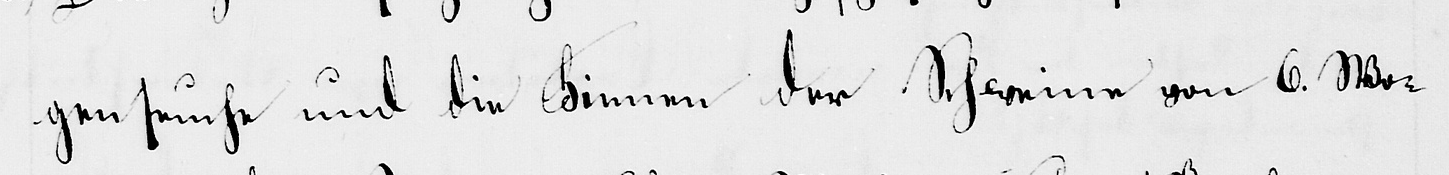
genseuche und die Finnen der Schweine von 6. Wo¬
